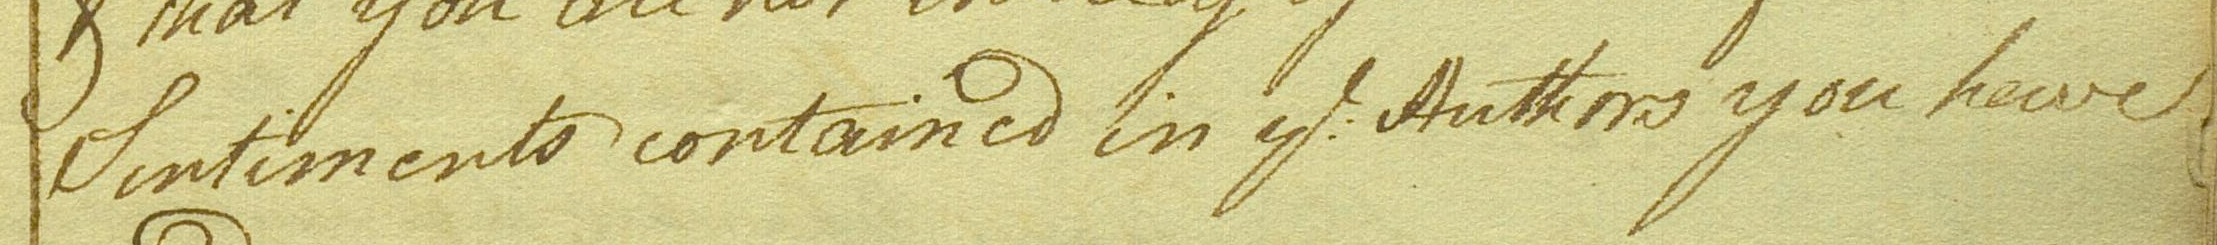Sentiments contained in y^e. Authors you have
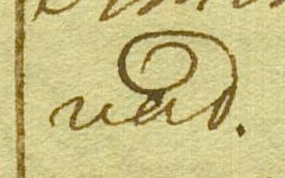read.
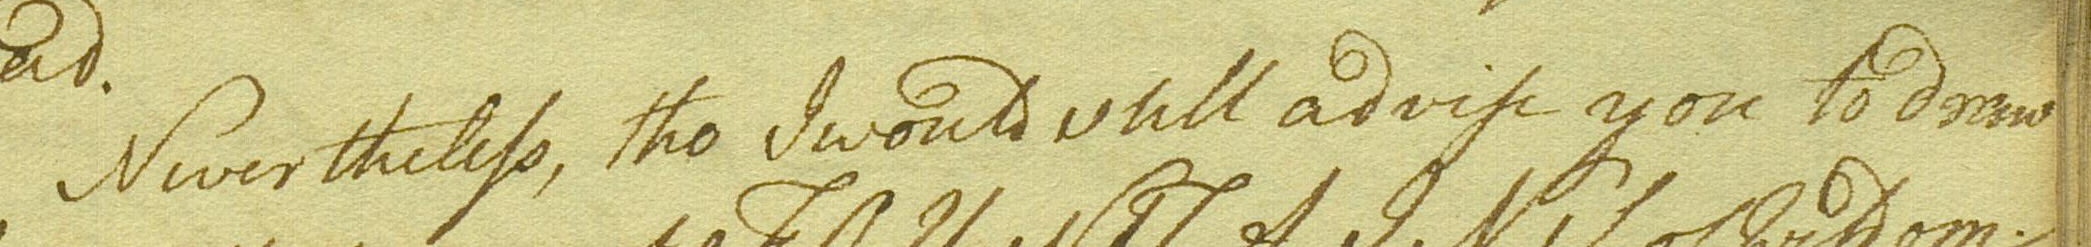Nevertheless, tho I would well advise you to draw
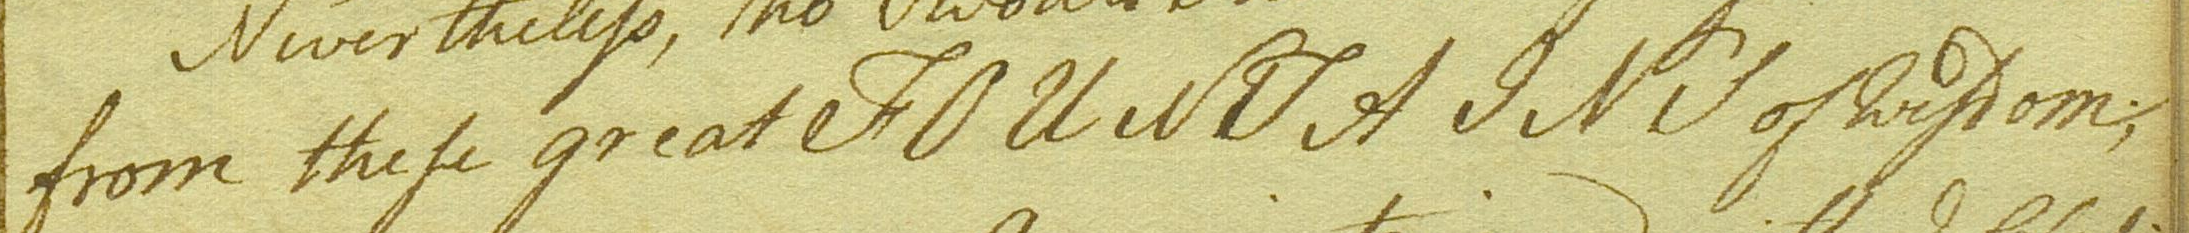from these great FOUNTAINS of Wisdom;
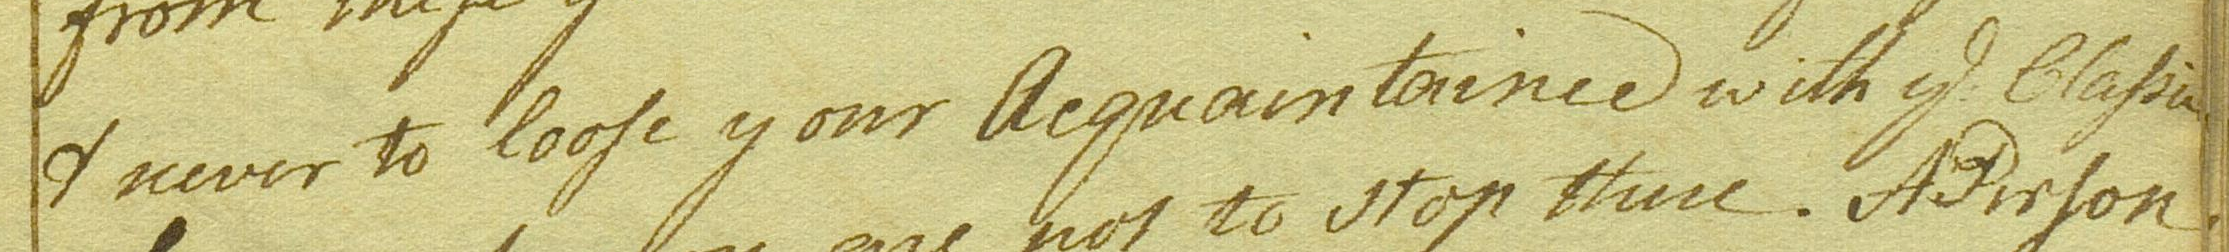& never to loose your Acquaintaince with y^e Classic
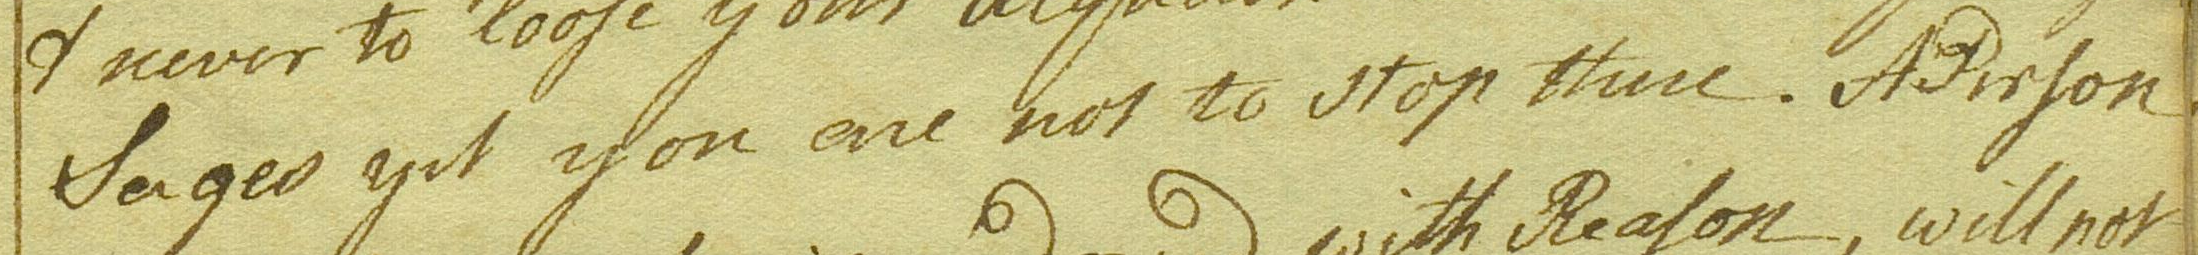Sages yet you are not to stop there. A Person
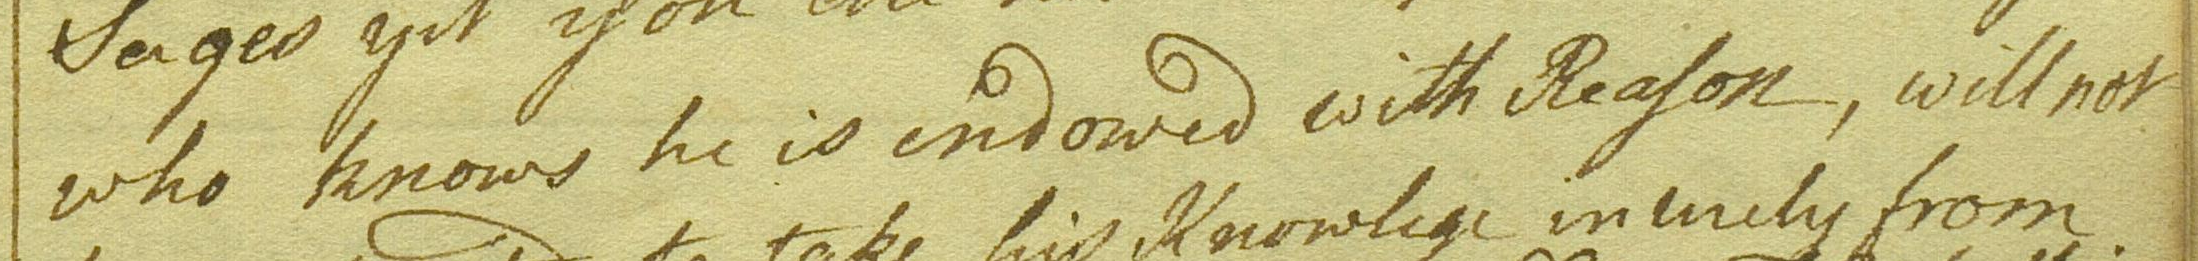who knows he is endowed with Reason, will not
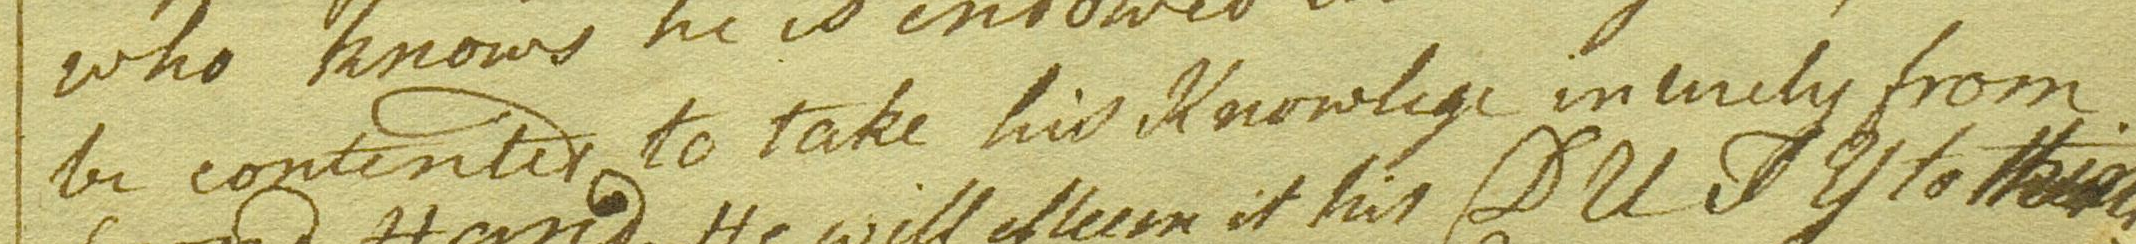be contented to take his knowledge intirely from
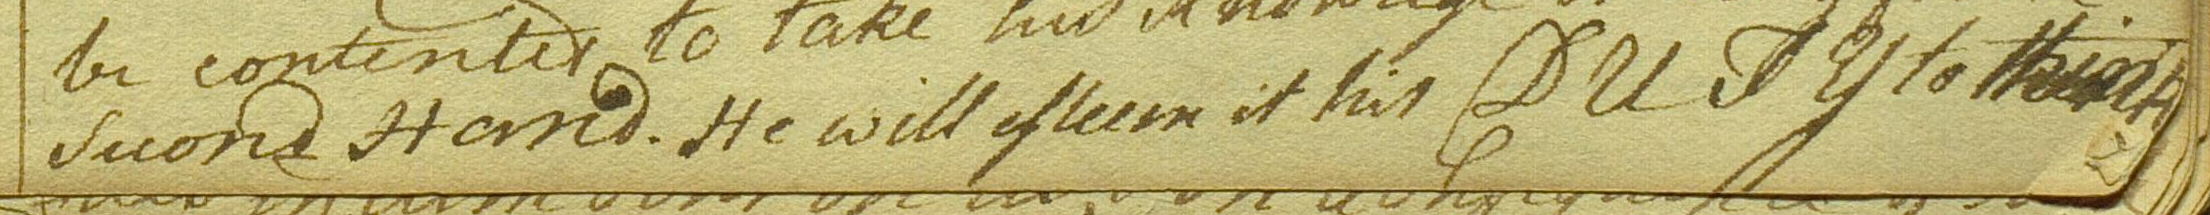second Hand. He will esteem it his DUTY to think
